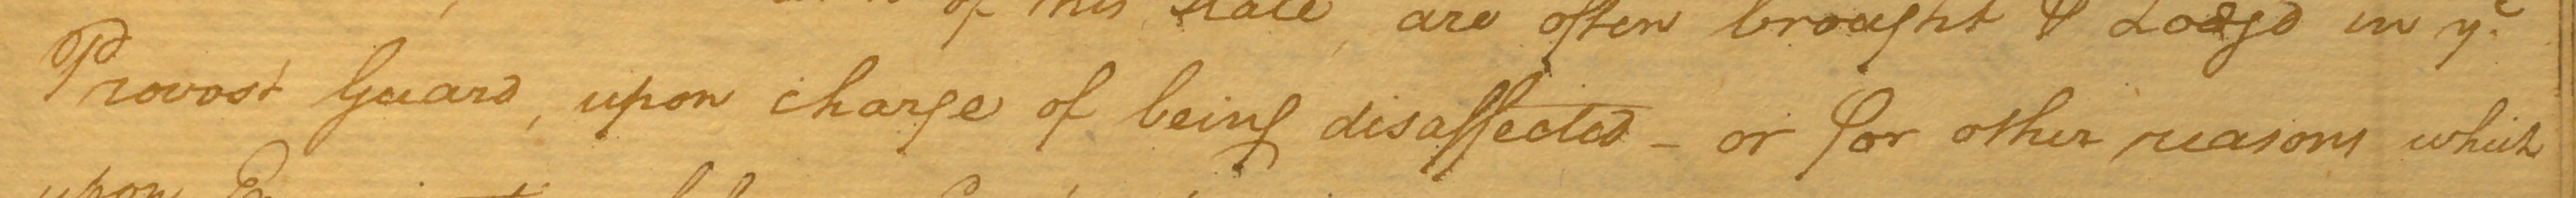Provost Guard, upon charge of being disaffected- or for other reasons which
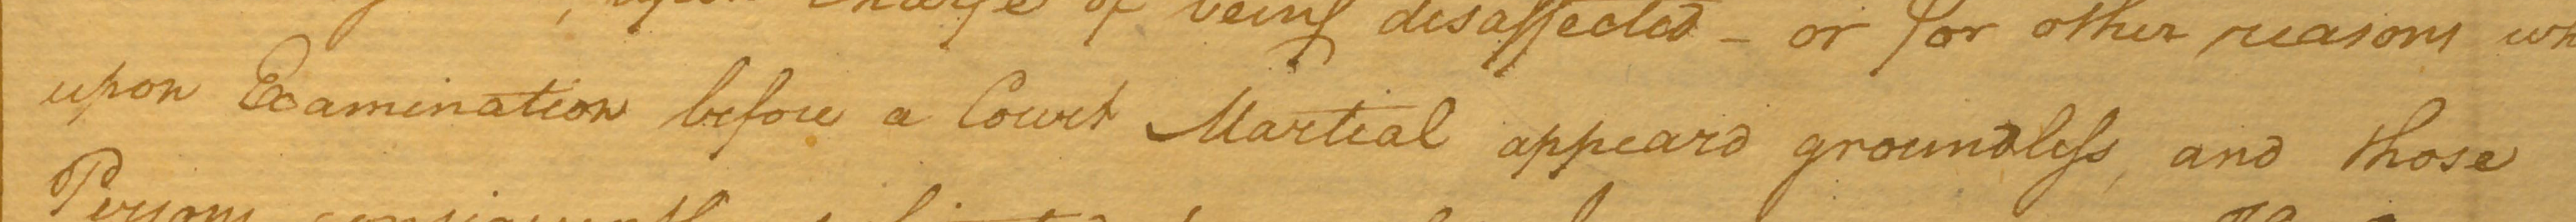upon Examination before a Court Martial appeared groundless and those
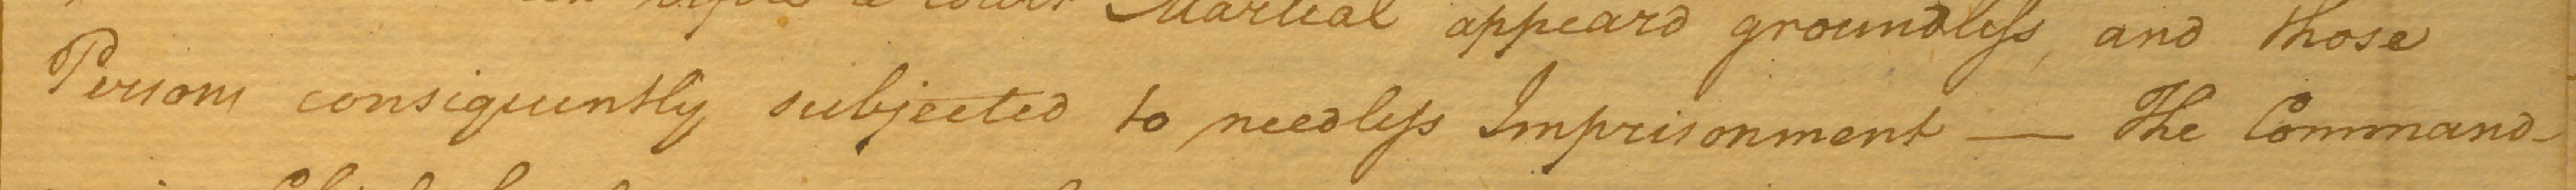Persons consiquently subjected to needless Imprisonment- The Command-
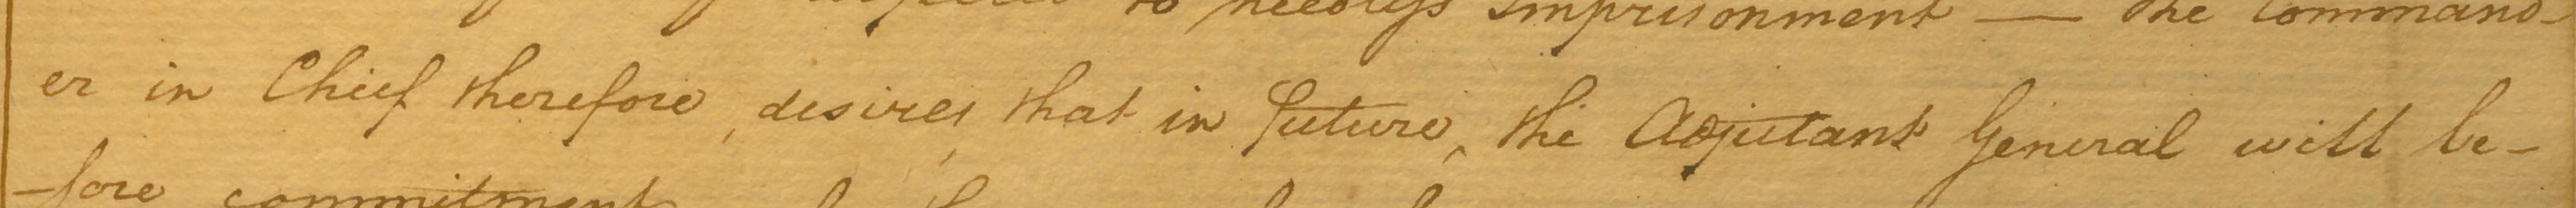er in Chief therefore desires that in future, the Adjutant General will be-
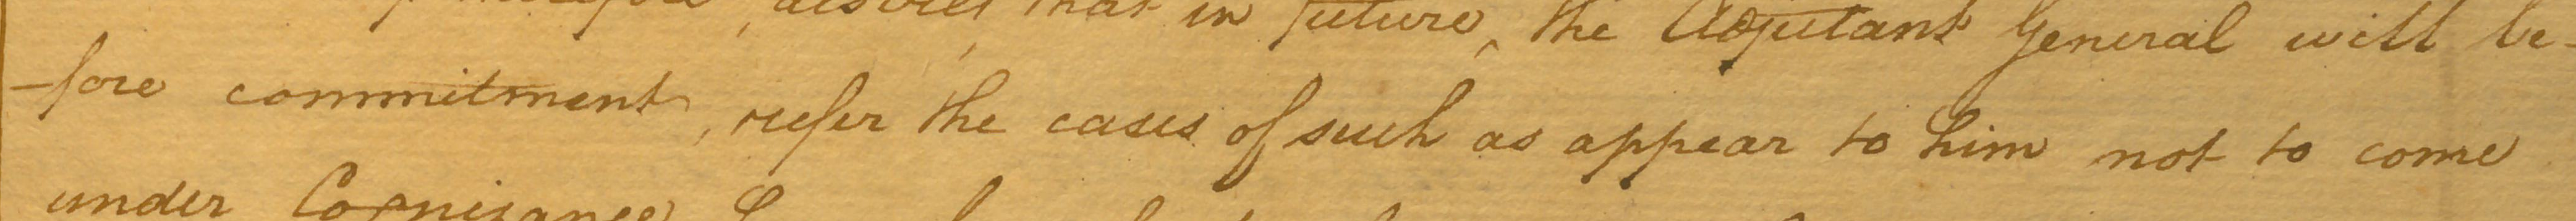-fore commitment refer the cases of such as appear to him not to come
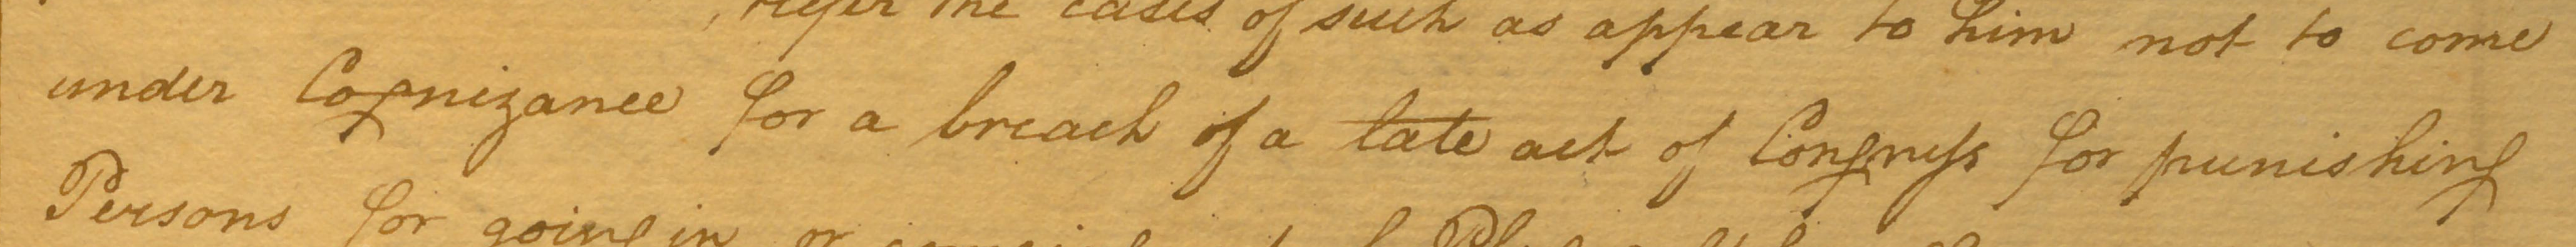under Cognizance for a breach of a late act of Congress for punishing
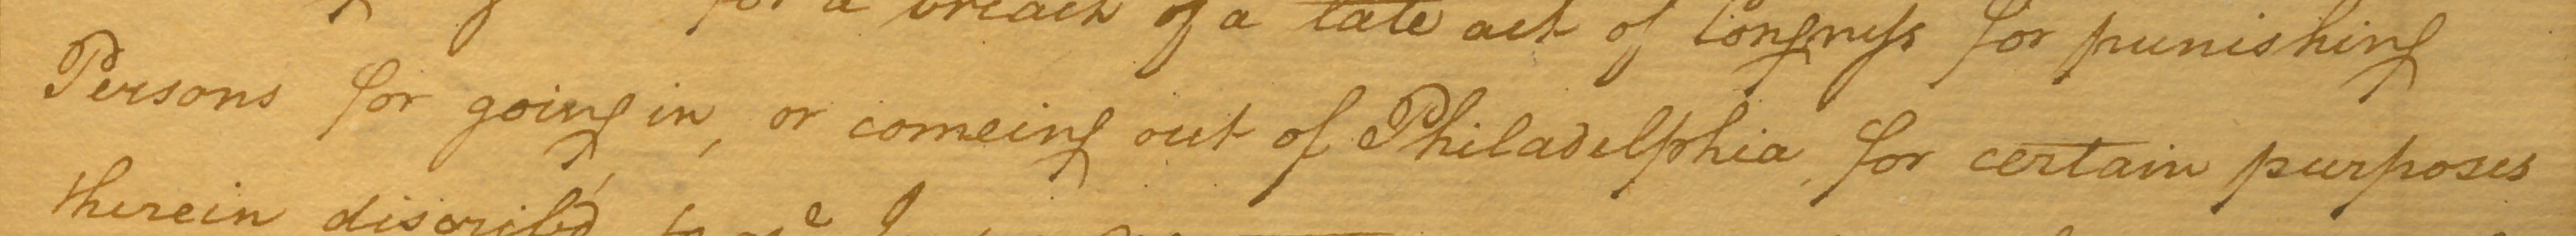Persons for going in, or comeing out of Philadelphia for certain purposes
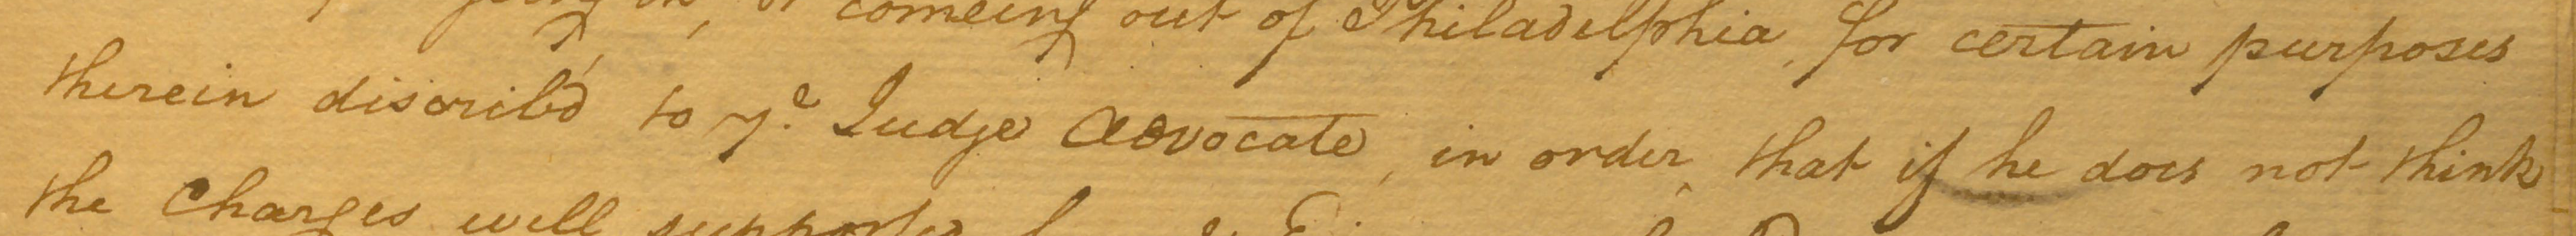therein discribd to y^e. Judge Advocate in order, that if he does not think
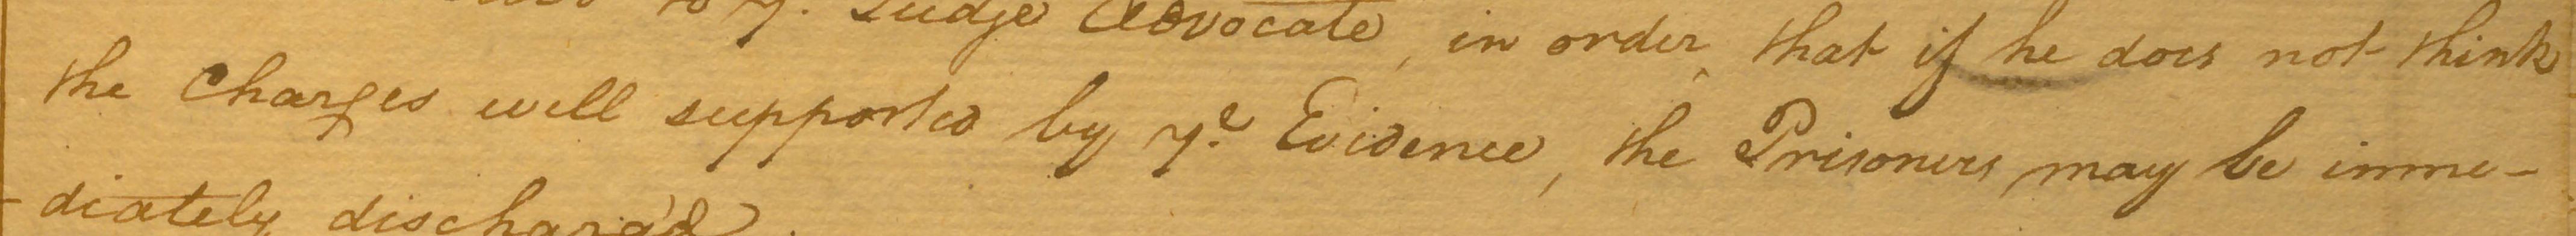the Charges will supported by y^e. Evidence, the Prisoners may be imme-
